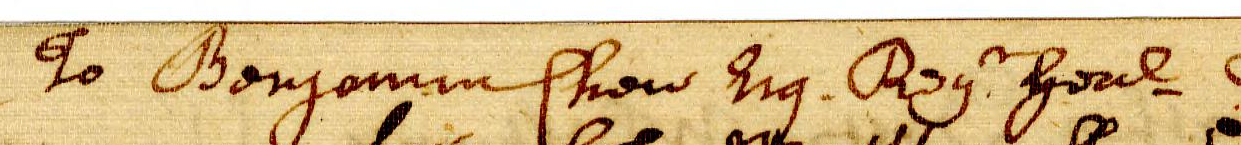to Benjamin Chew Esq Reg^r. Gen^l
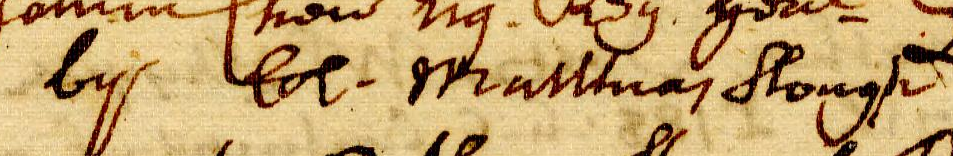by Col Matthias Slough
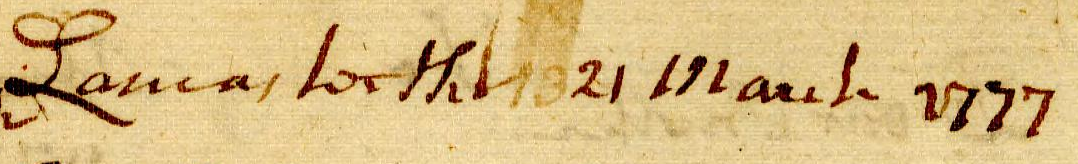Lancaster the [13] 21 March 1777
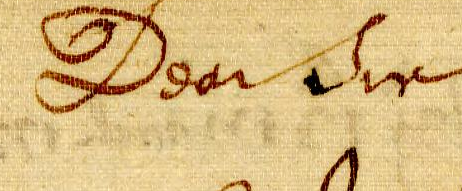Dear Sir
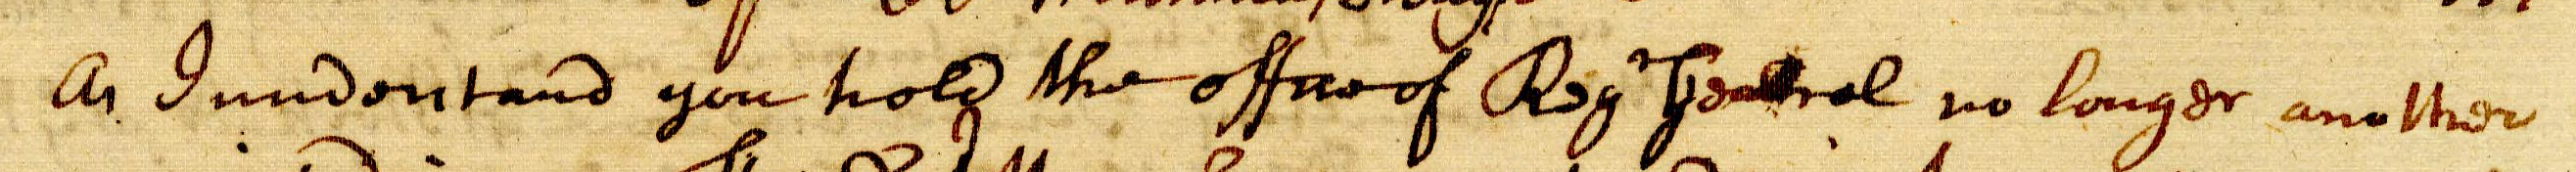As I understand you hold the office of Reg^r. General no longer another
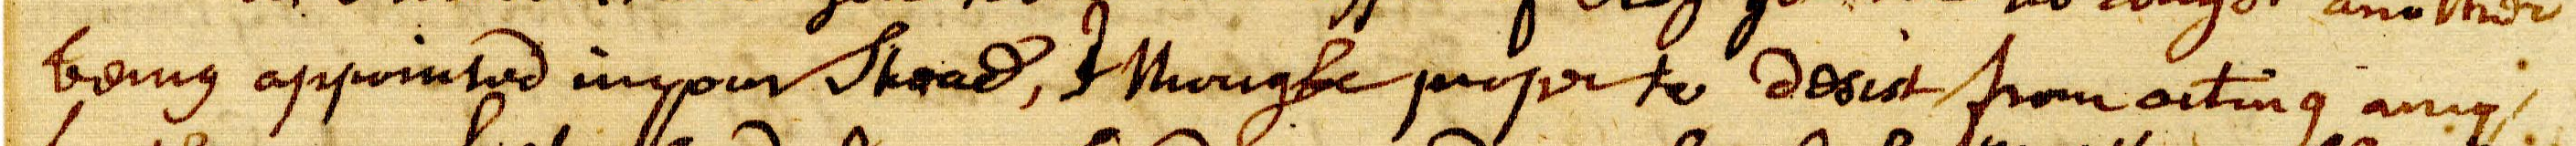being appointed in your Stead, I thought proper to desist from acting any
